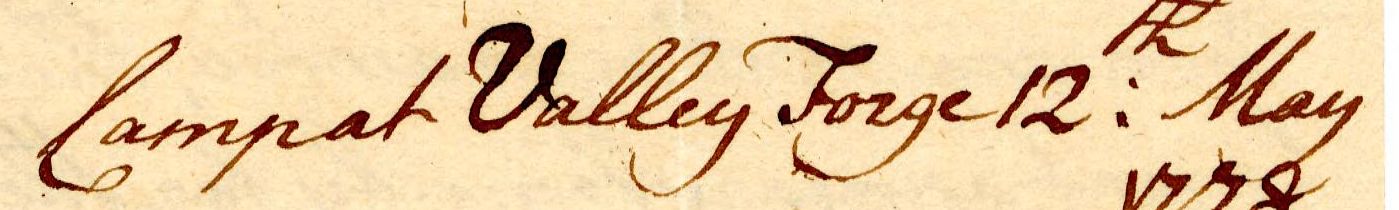Camp at Valley Forge 12^th: May
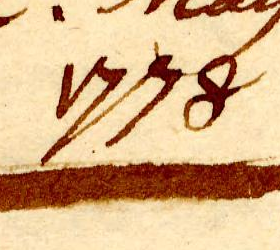1778
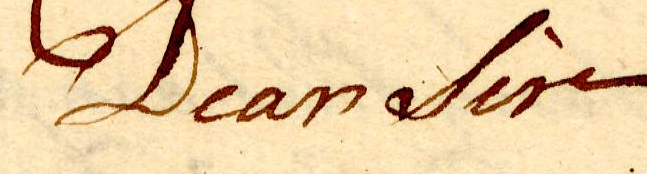Dear Sir
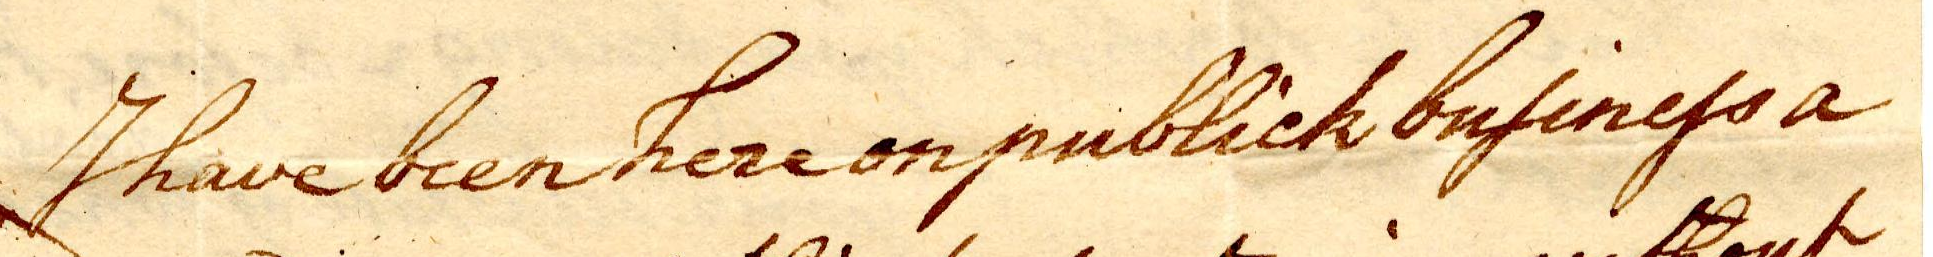I have been here on publick business a
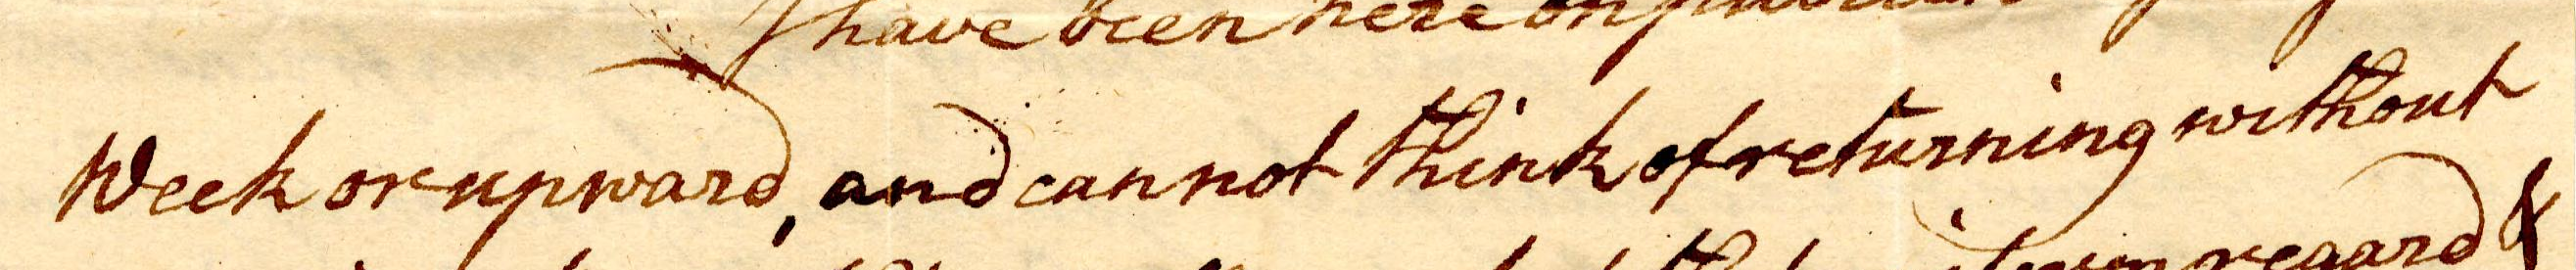Week or upward, and cannot think of returning without
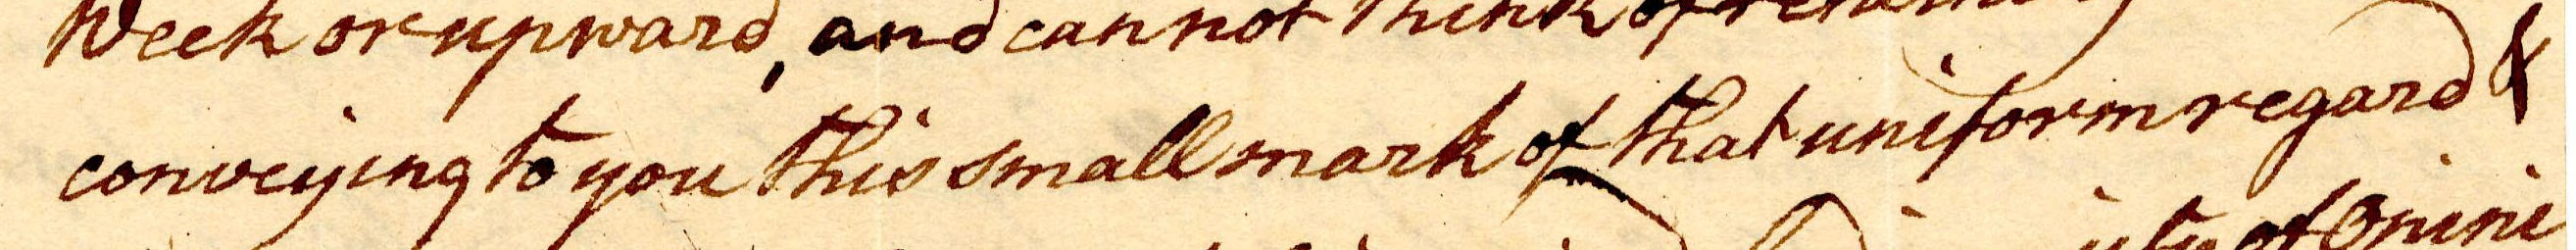conveying to you this small mark of that uniform regard &
